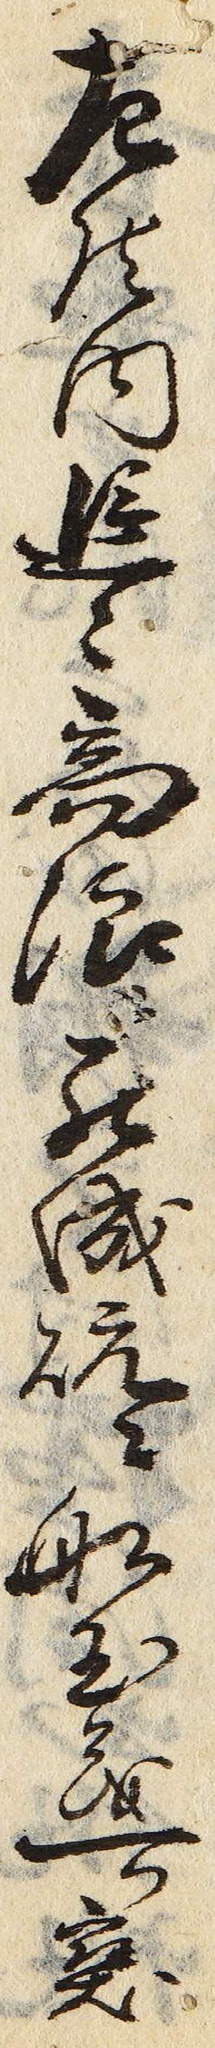左候内追々高浪罷成既ニ船玉も一ツ突
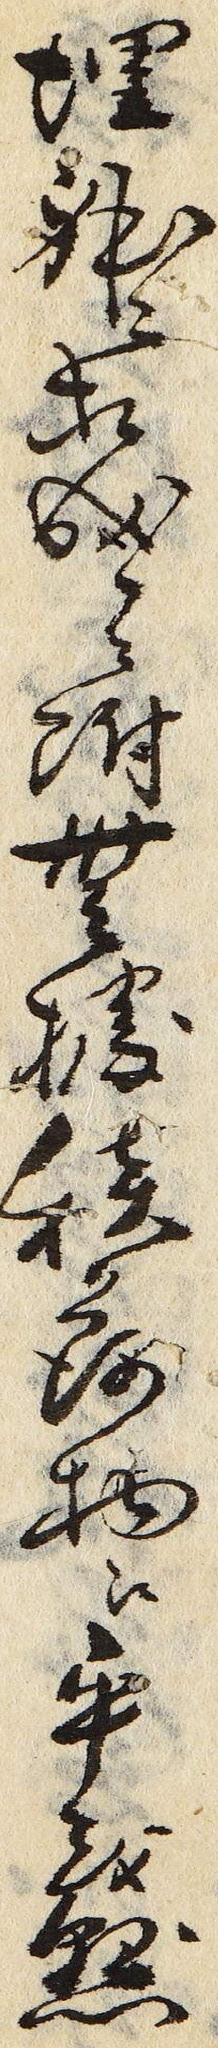埋体ニ相成候ニ付無拠積荷物江手を懸
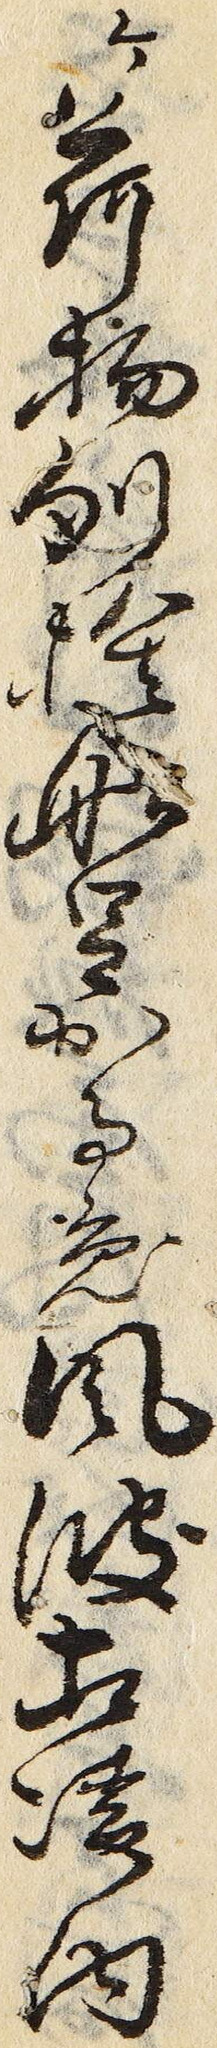ケ荷物刎捨船足かるめ風波相凌内
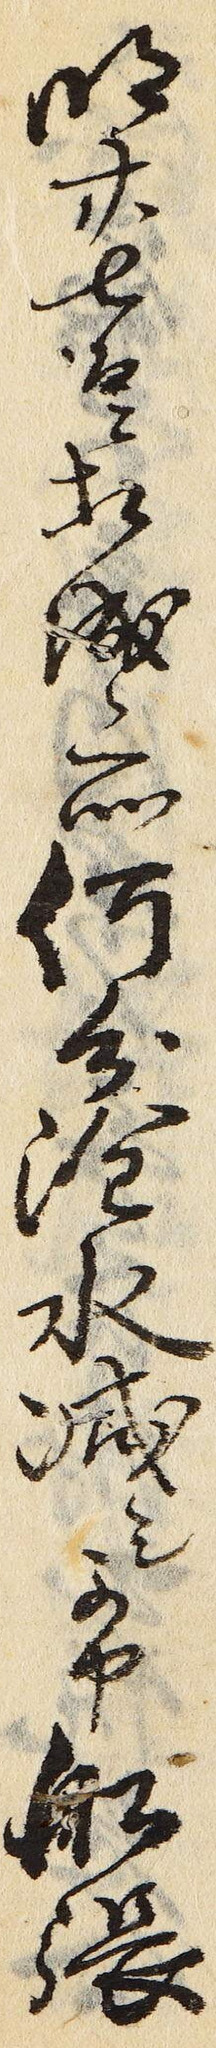明廿七日ニ相成候所何分注水減シ不申船張
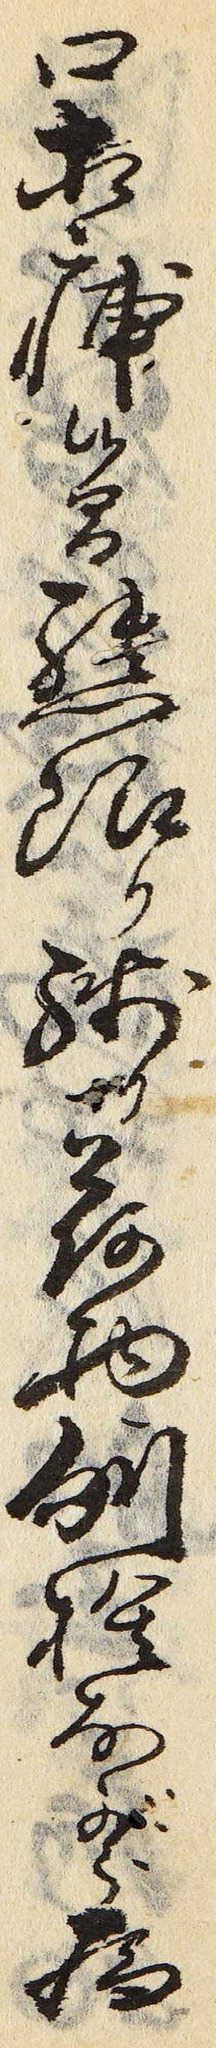口相痛候間態限り残り荷物刎捨ながら為
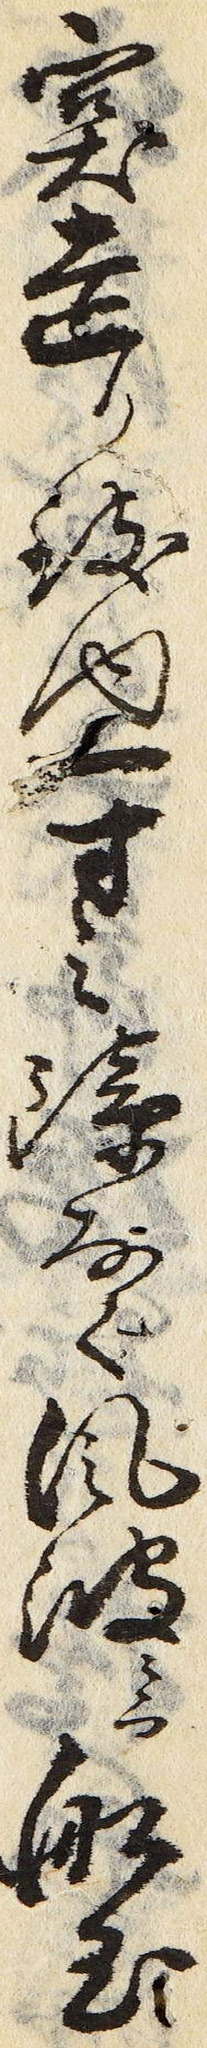突走り致内一寸之隙なく風波ニ而船玉
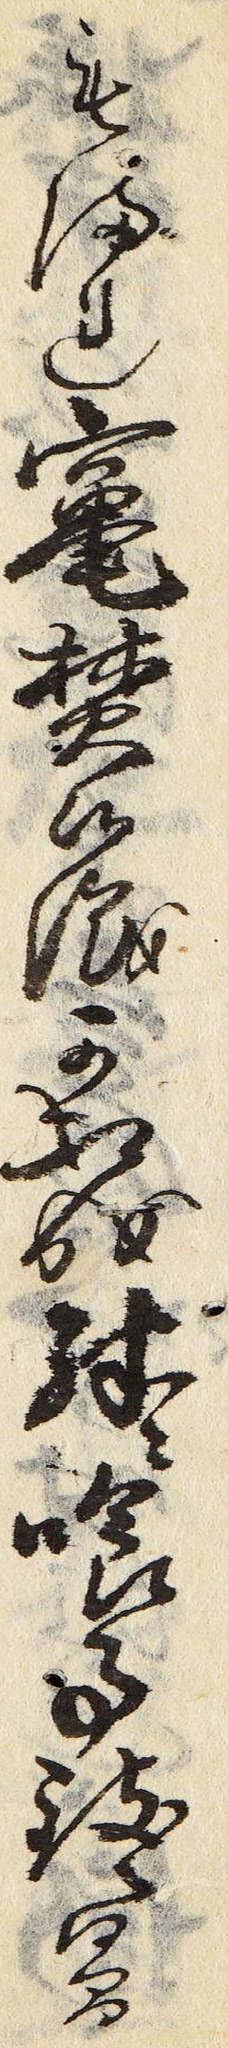もまれ竃焚候儀不相成殊ニ喰事致候日間
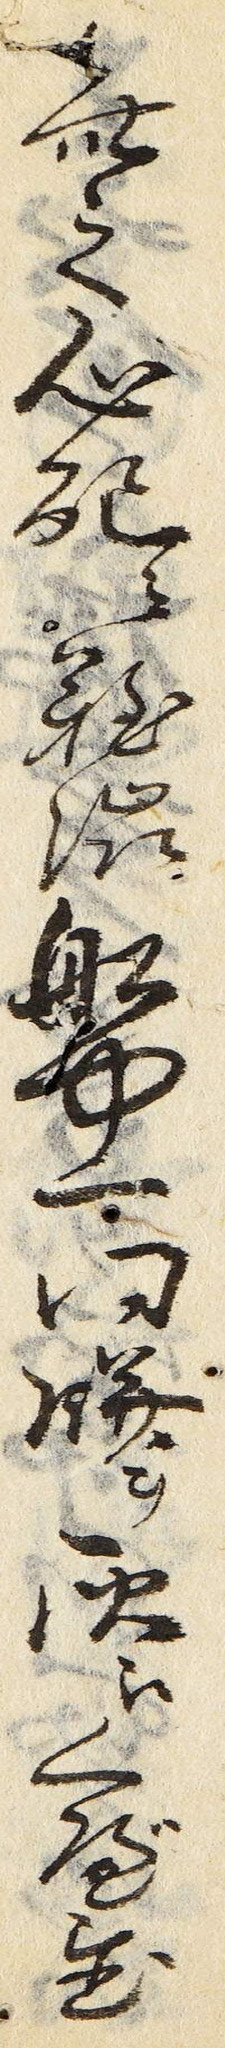も無之心配ニ難渋船中一同餅ヲ灰江くべ置
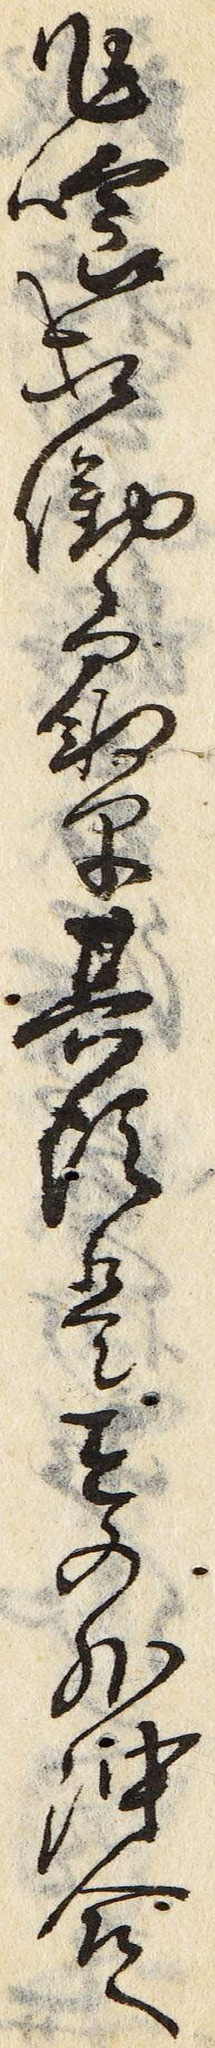乍喰相働候最早其頃はことの外沖合へ
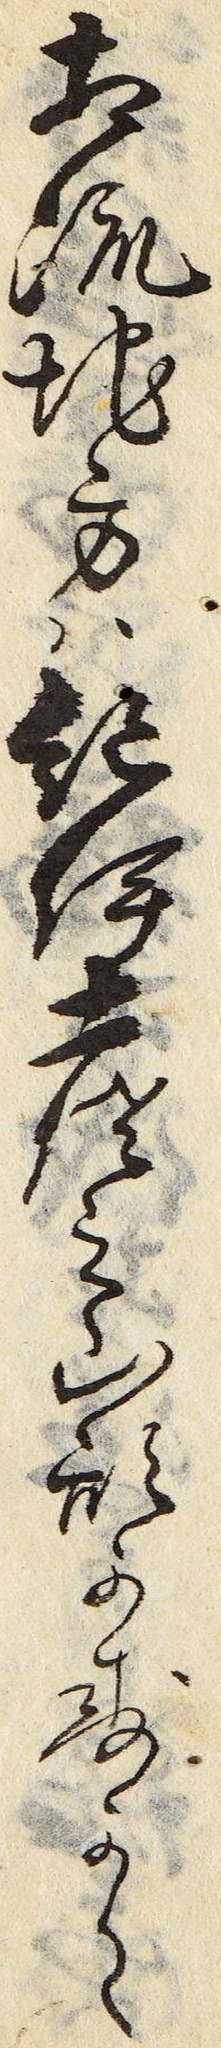相流地方ハ紀伊土佐之山形かすかに
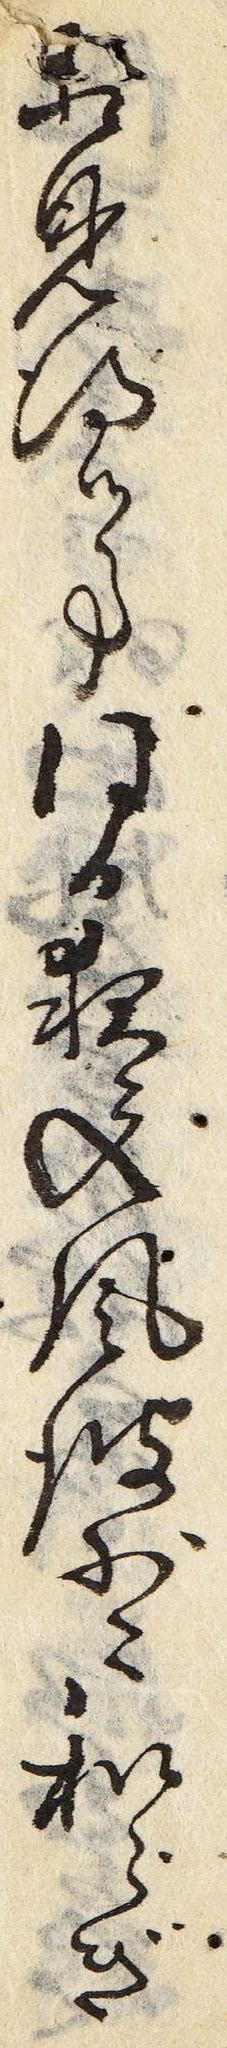相見得候事同日夜ニ入風波少々和らぎ
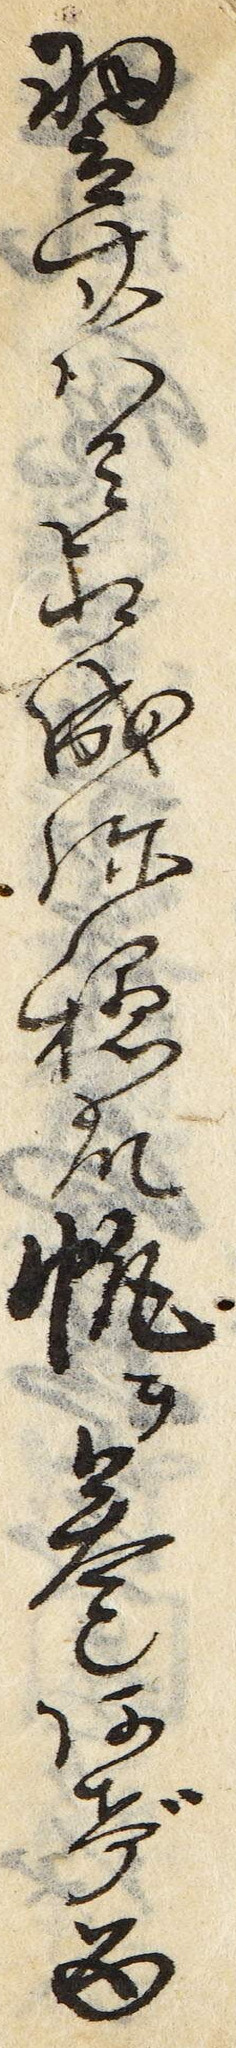翌廿八日ニ相成弥穏故帆ヲ巻あげ酉
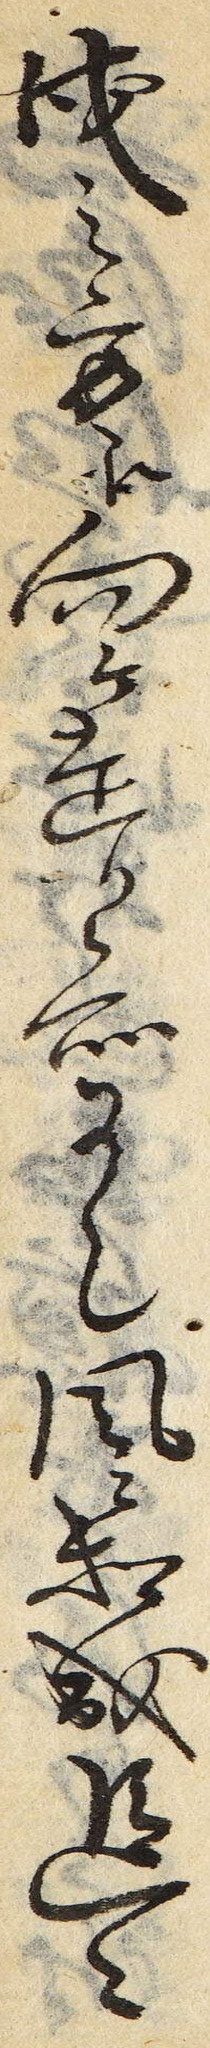戌之方江向ケ走り候所にし風ニ相成追々

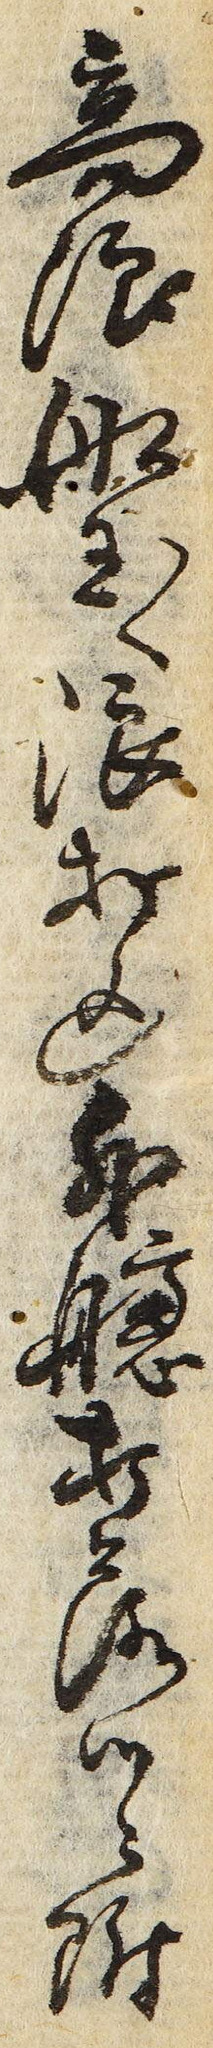高浪船玉へ浪打込外艫打落候ニ付
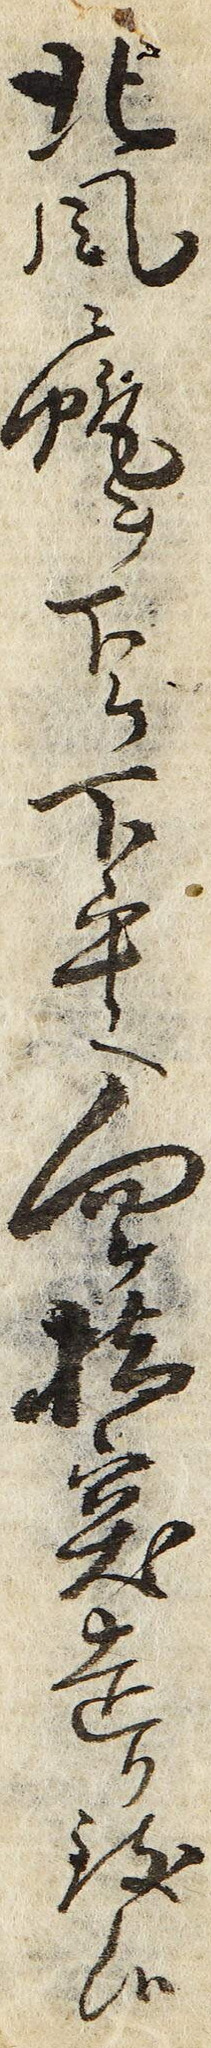北風ニ帆ヲ下ケ下手へ向ケ指突走り致候
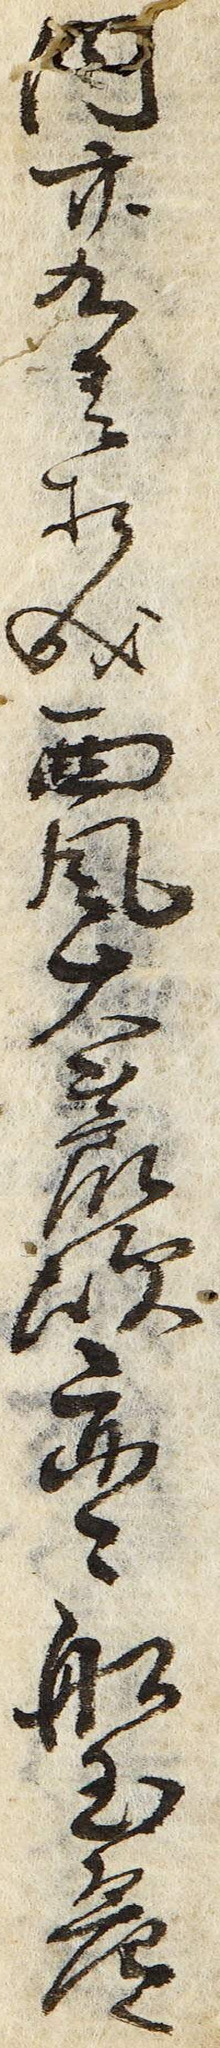内廿九日ニ相成西風大荒吹亦々船玉危く
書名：阿波幸宝丸漂流記
